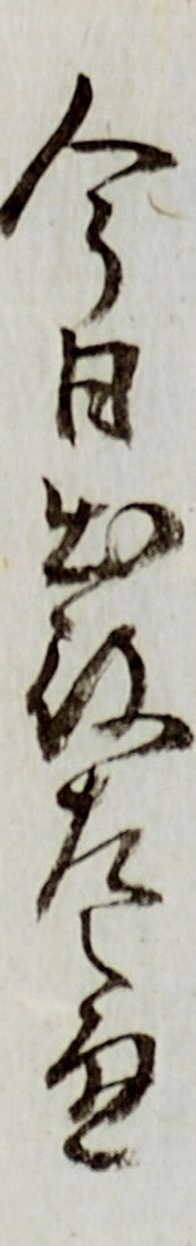今日出役左之通
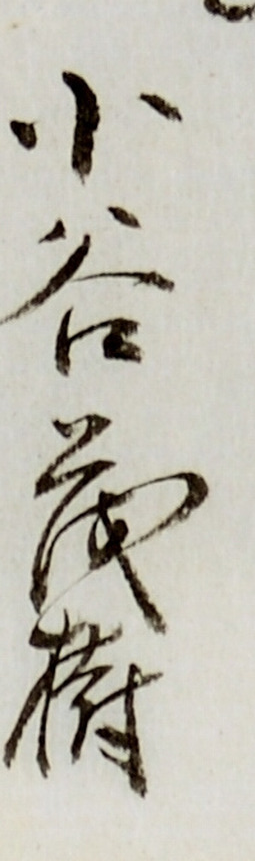小谷茂樹
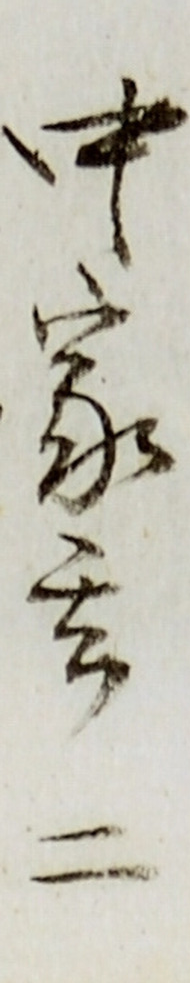中家玄二
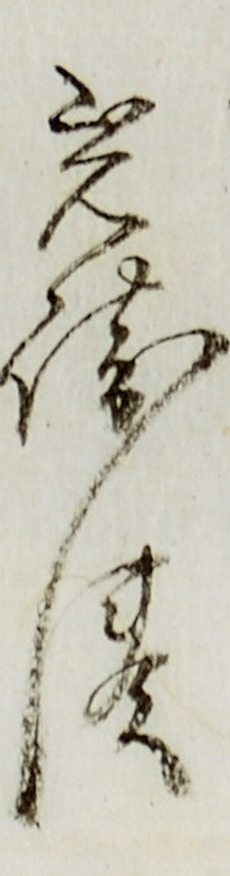岩崎湊
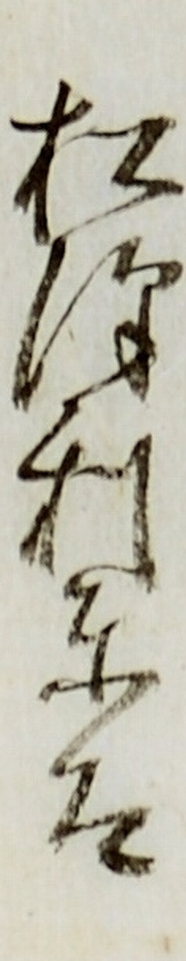松沢利東太
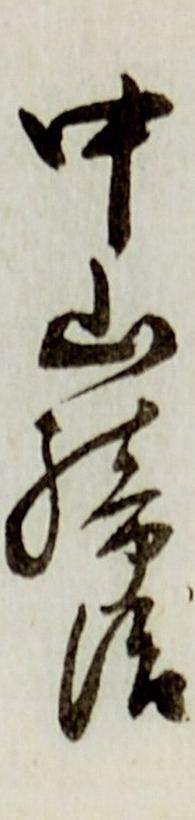中山締治
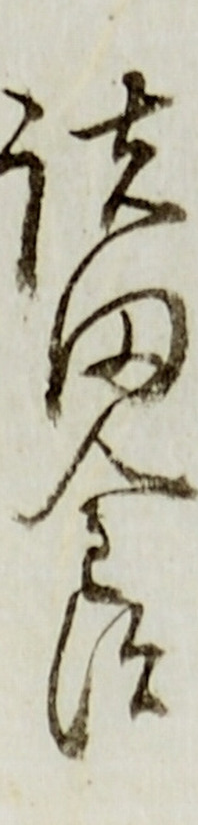諸田金治
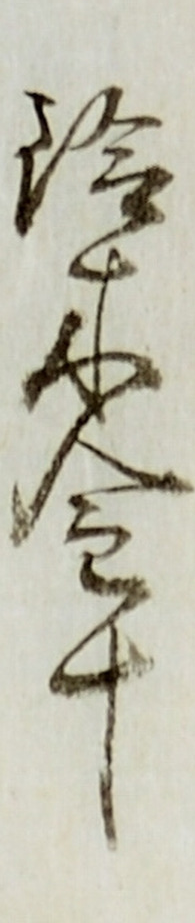鈴木金十
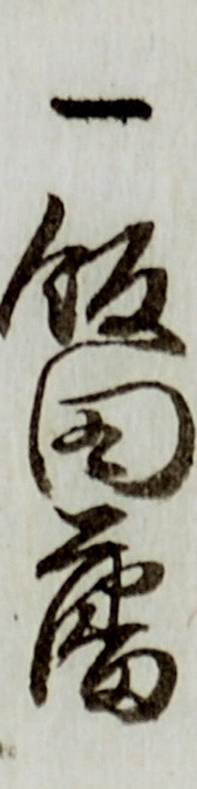一飯田藩
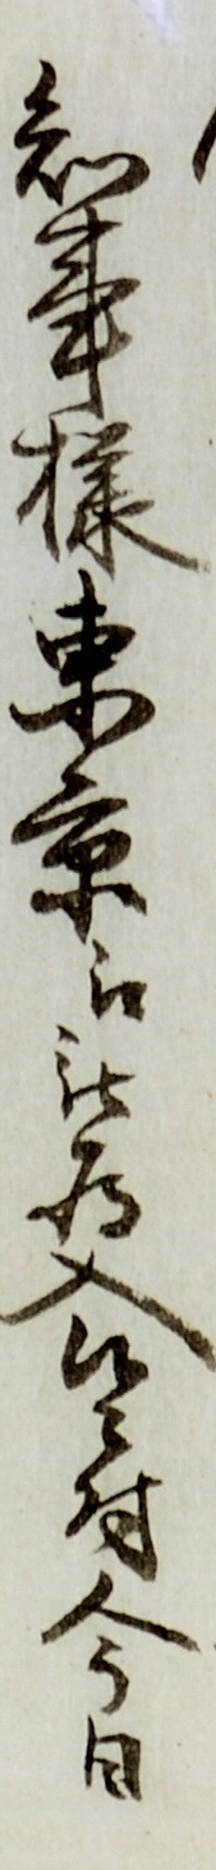知事様東京え被為入候に付今日
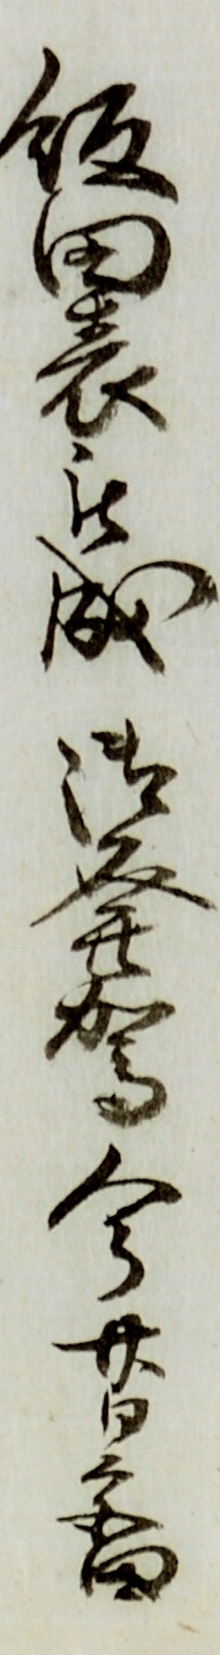飯田表被成御発駕今廿日宮田
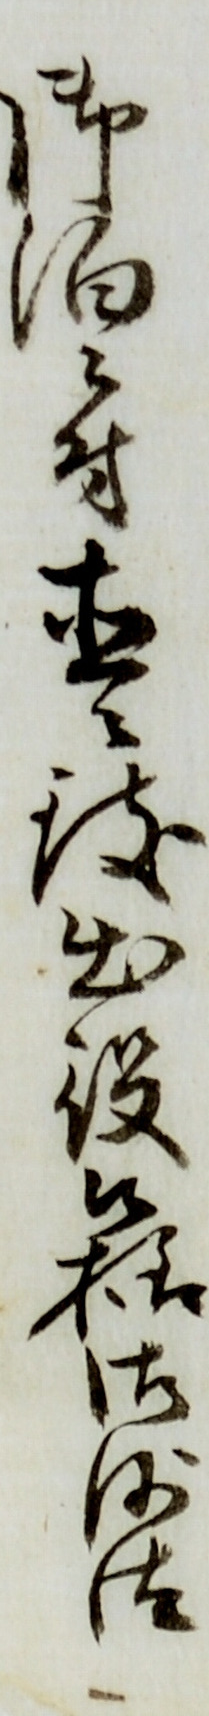御泊に付直に致出役候様御沙汰
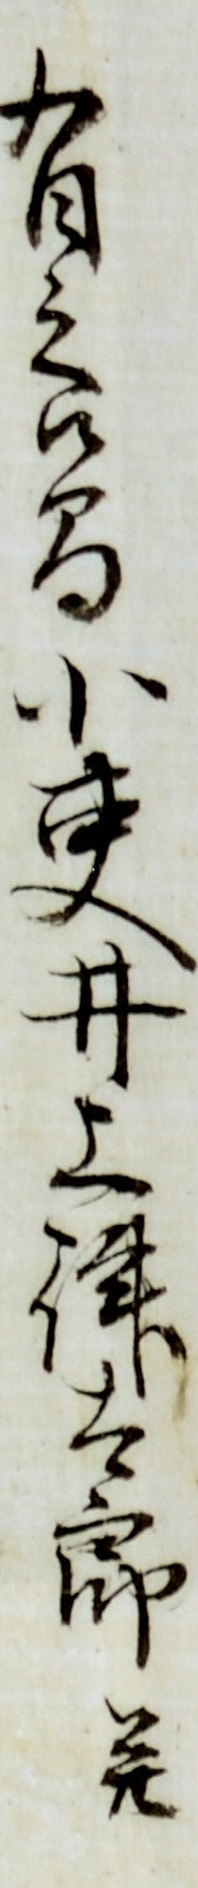有之候間小吏井上律太郎幷
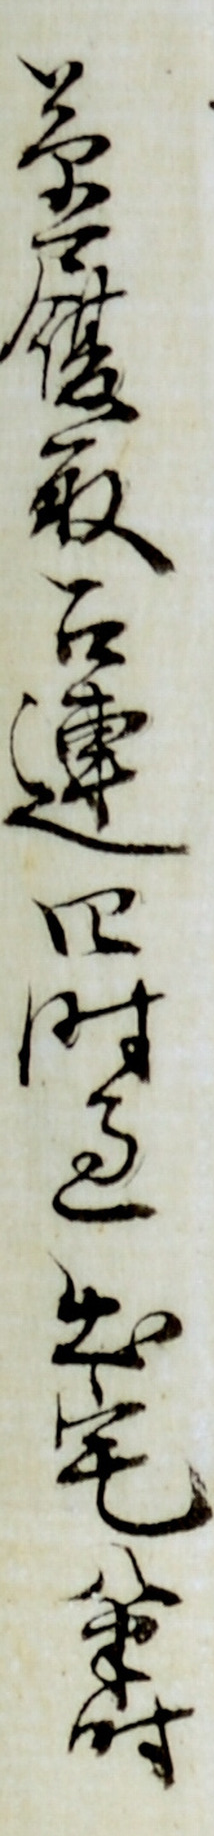草履取召連四時過出宅八半時

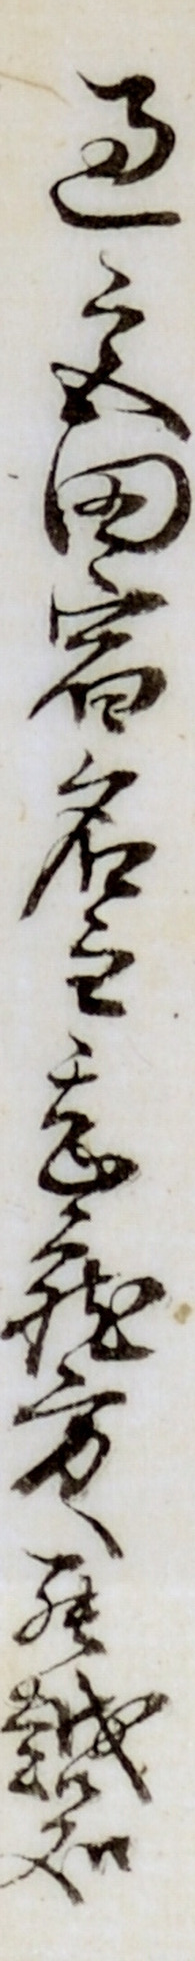過宮田宿名主甚蔵方へ罷越候処
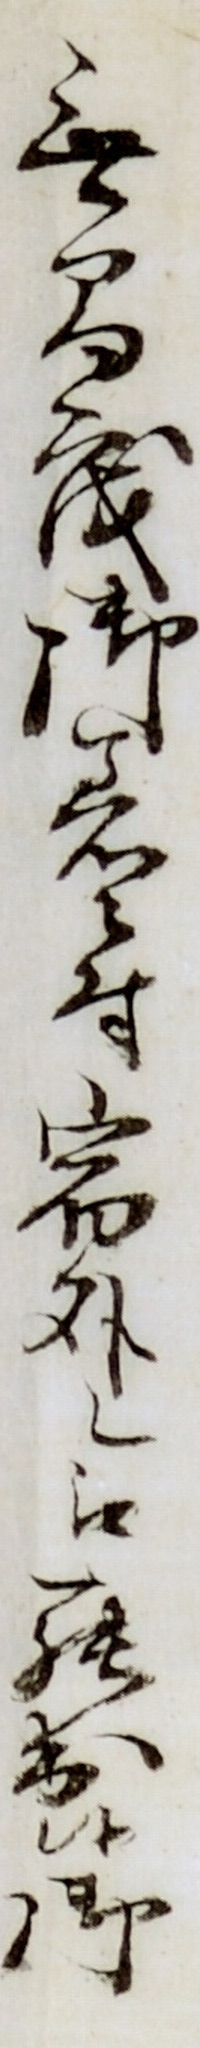無間も御着に付宿外レえ罷出候御
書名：山林方諸事御用留
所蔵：伊那市立高遠町図書館・合同会社AMANE
